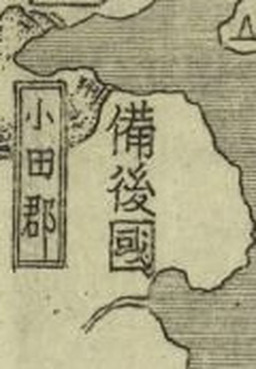備後國
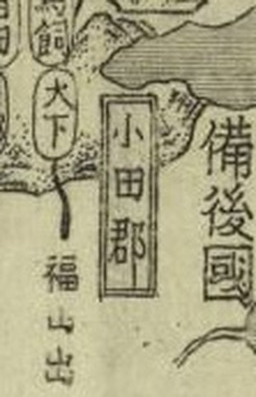下道郡
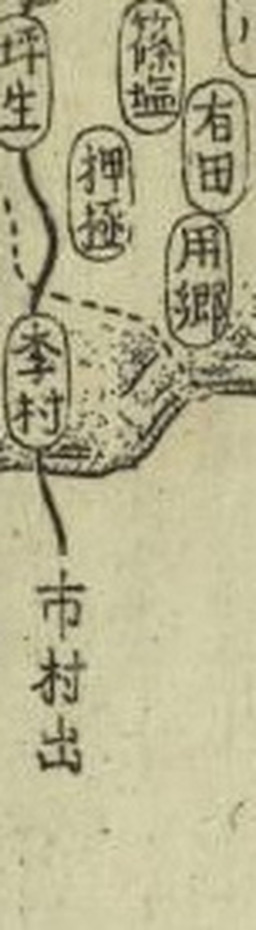市村出
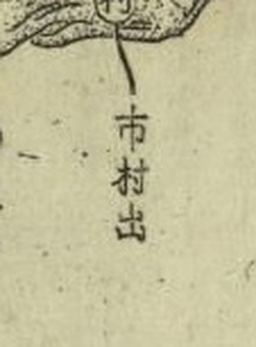市村出
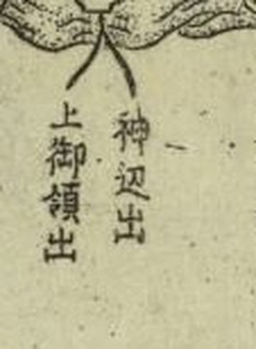神辺出
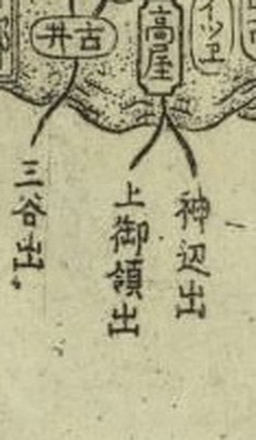上御領出
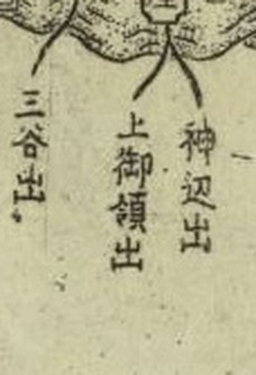上御領出
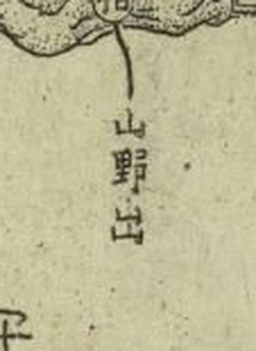山野出
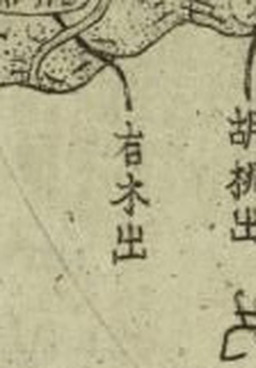有木出
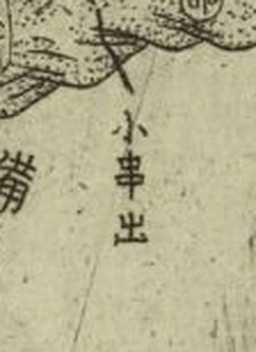小串出
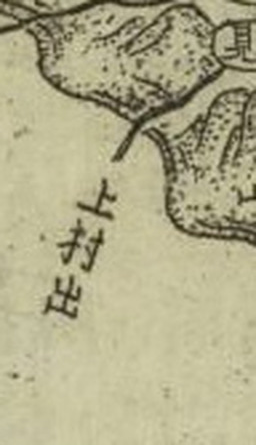上村出
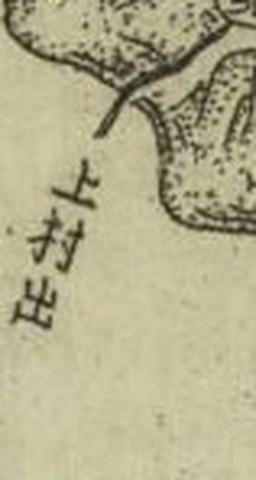上村出
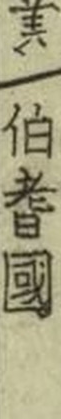伯耆國

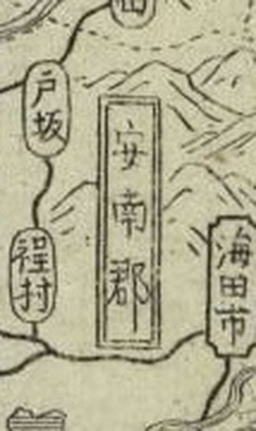安南郡
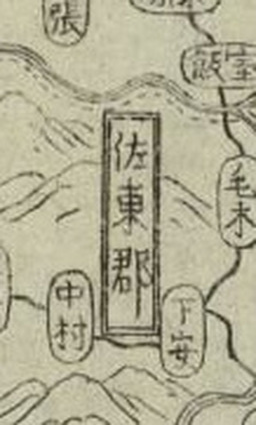佐東郡
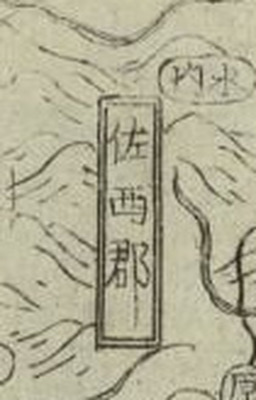佐西郡
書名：大日本国細図 西国之部 下
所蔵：University of the Ryukyus Library
